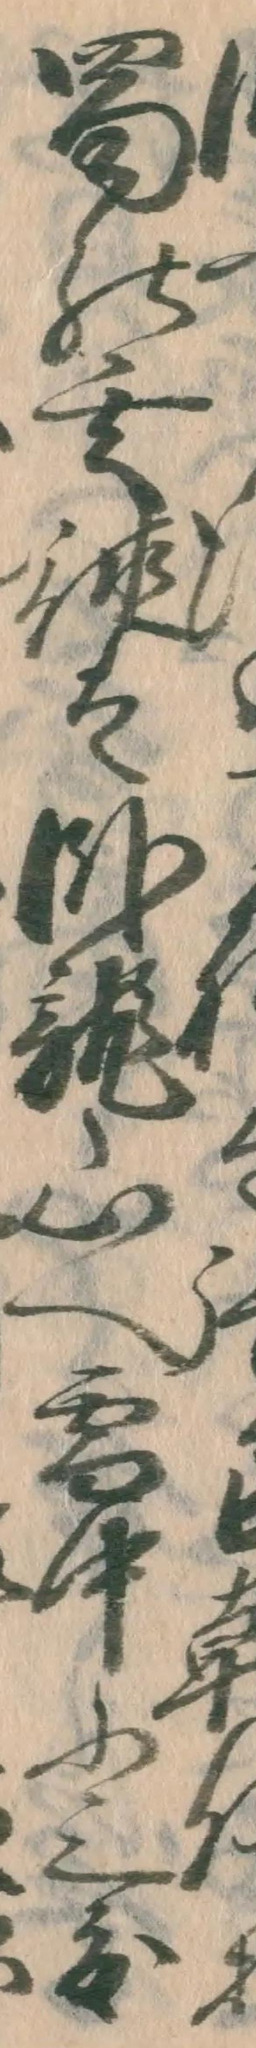蜀の玄徳は臥龍山へ雪中に三度
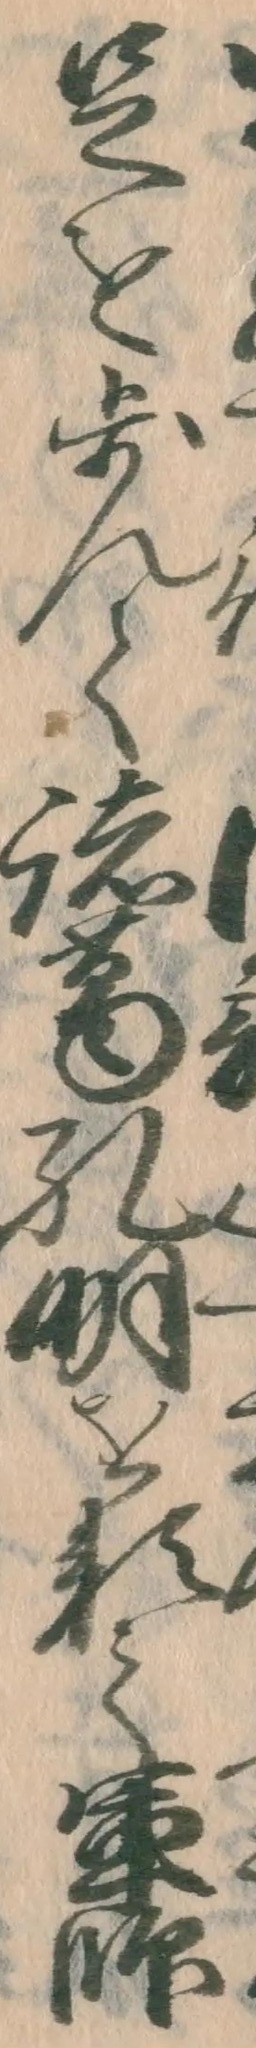足を歩んて諸葛孔明を頼て軍師
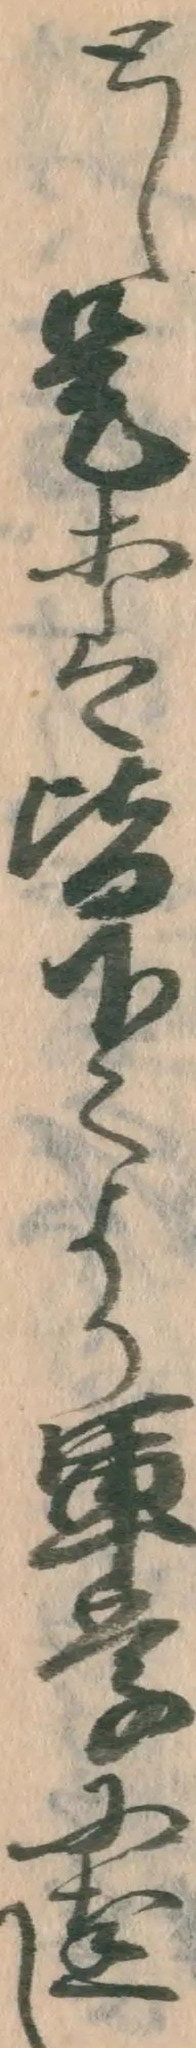とし是等は皆下々より軍学に達し
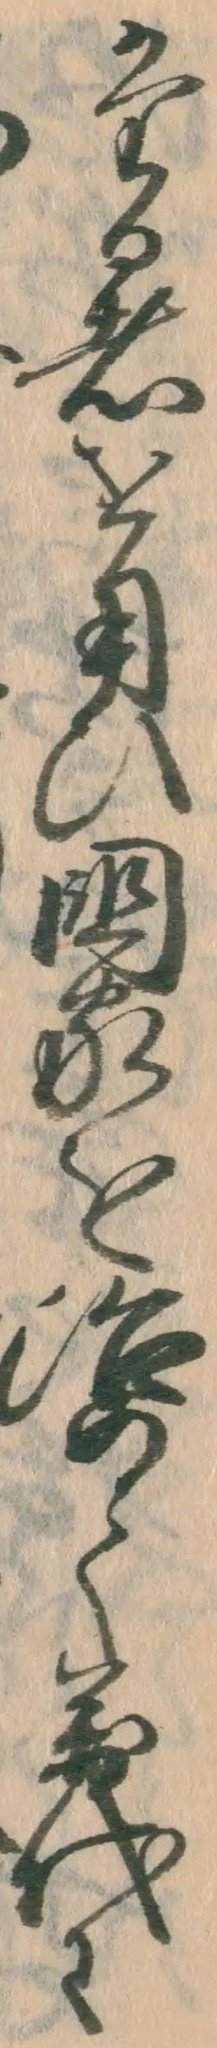たる者を用ひ国家を治めて萬代に
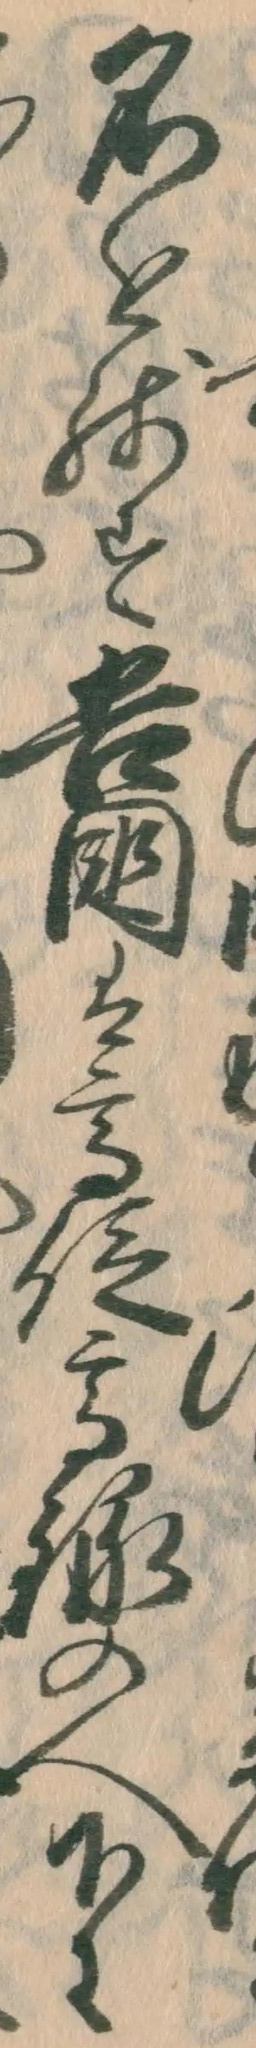名を残す吾国は高位高禄の人下に
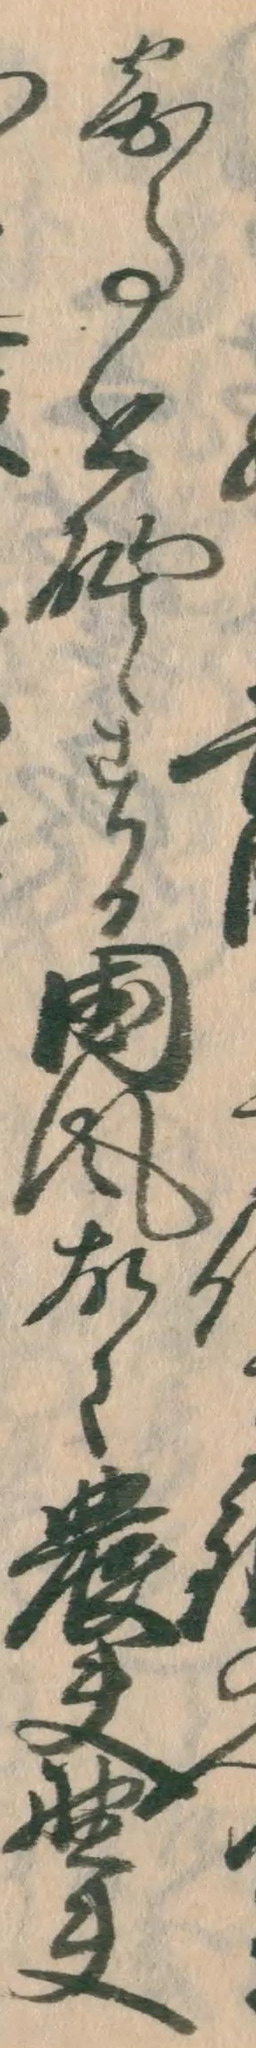寄事を恥とする国風故に農夫野夫
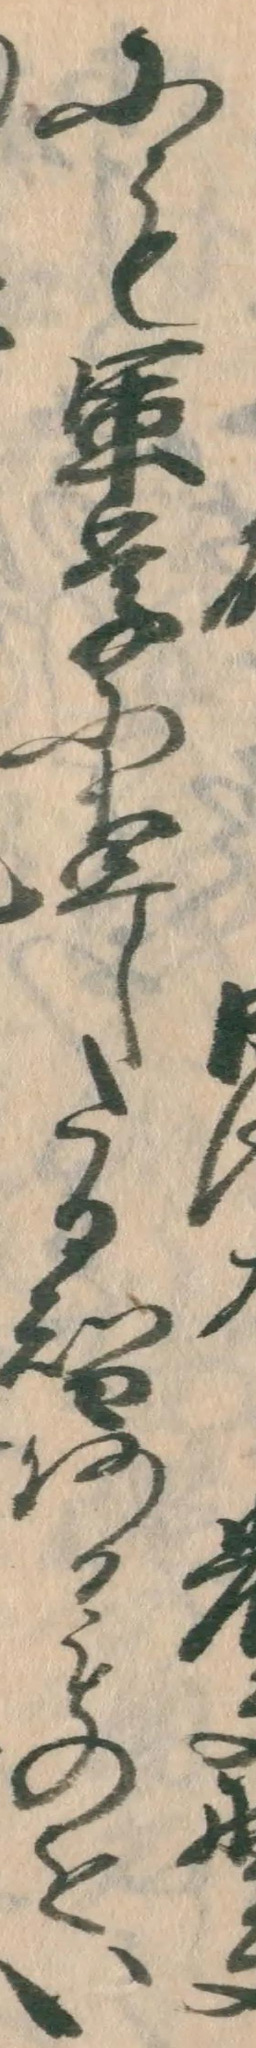にも軍学に達したる智あるものをい
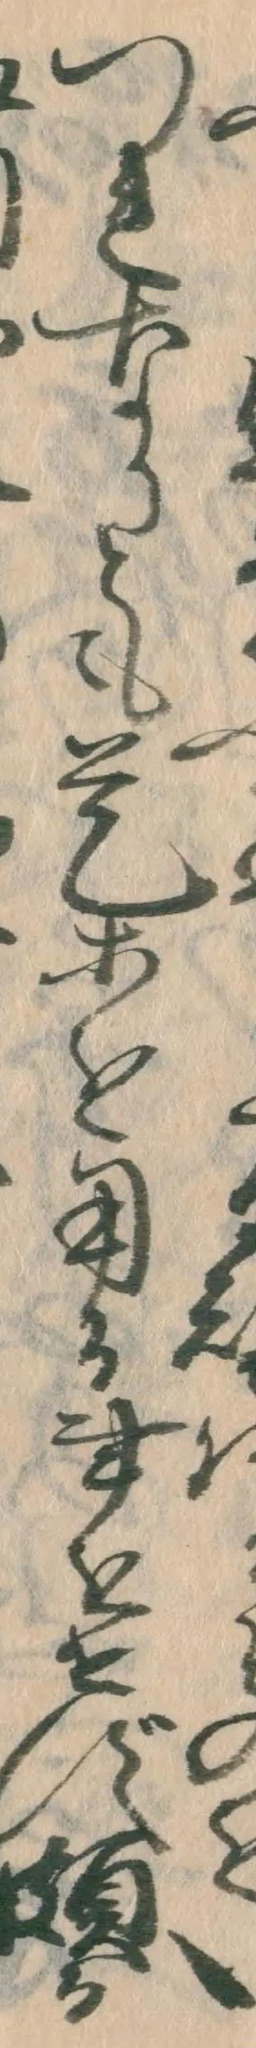つれなりとも是等を用る事をせず頗る
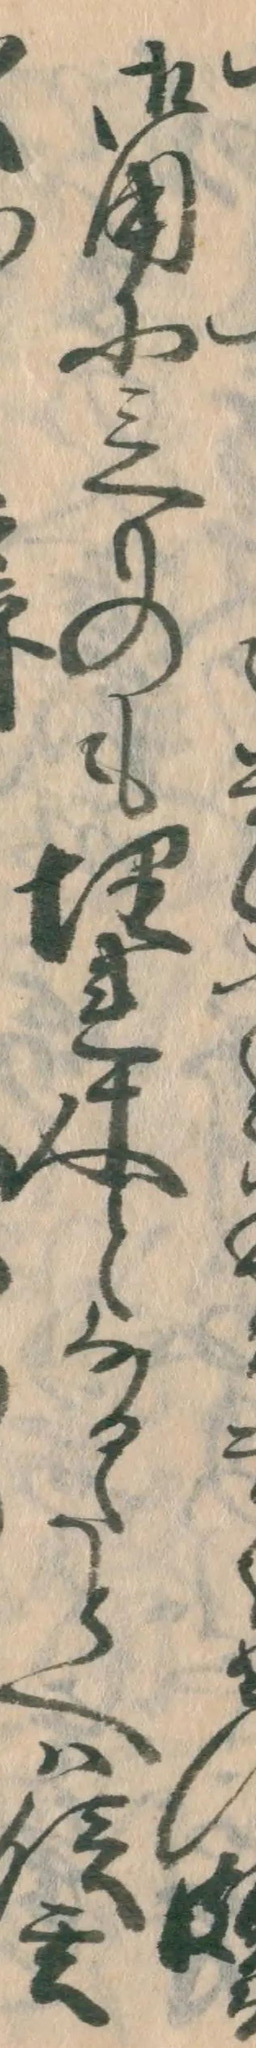御用に立ものも埋れ木となるたとへハ信玄
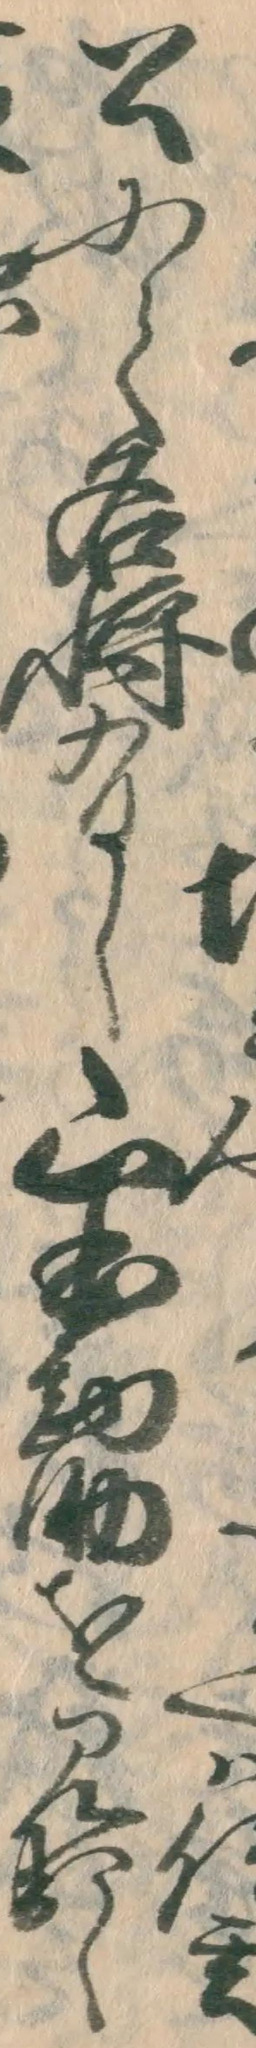公にて名将有し山本勘助を見出し
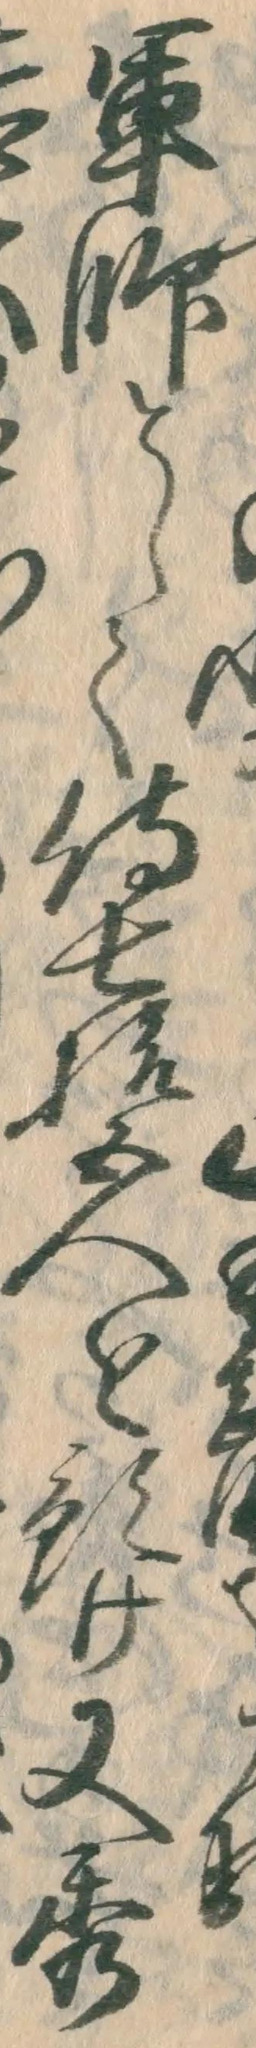軍師として侍七拾五人を預け又秀
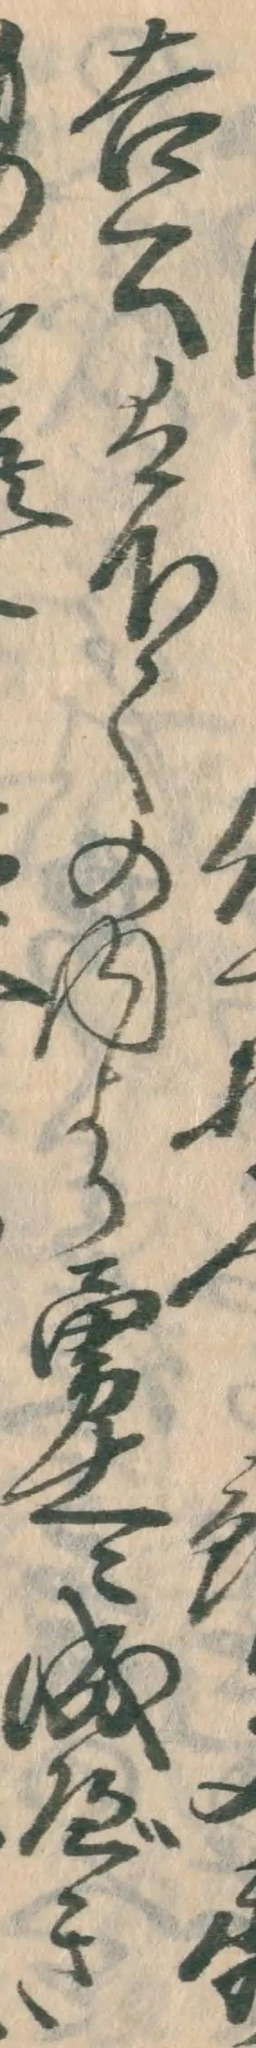吉公は下々の内より勇士ニ成べき
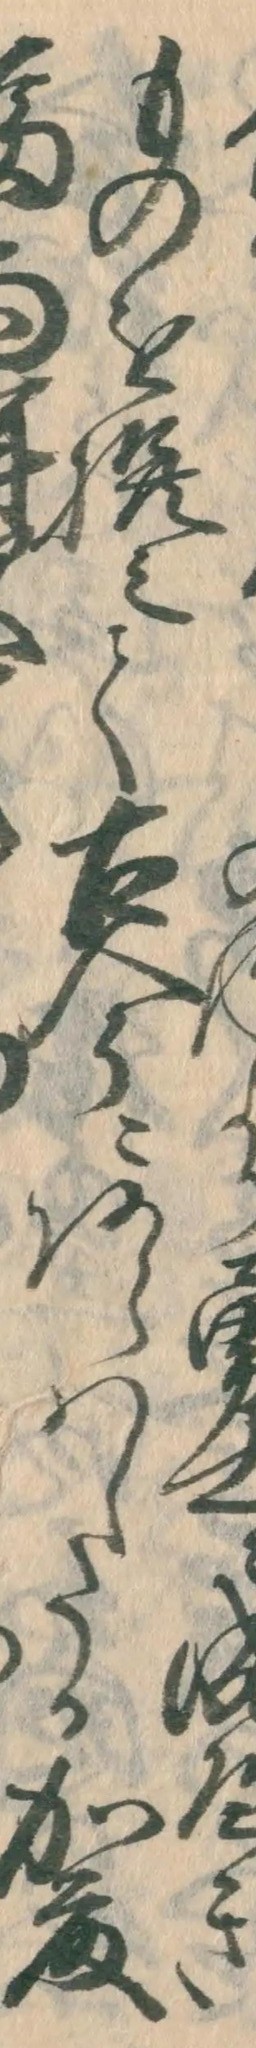ものを撰ミて古今ニあらはしたる加藤
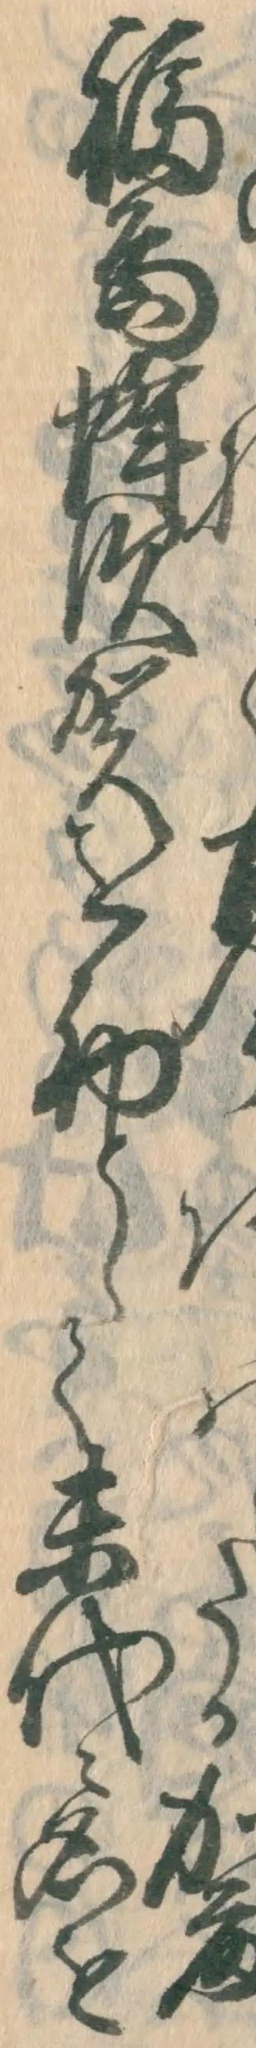福島蜂須賀を初として末代ニ名を

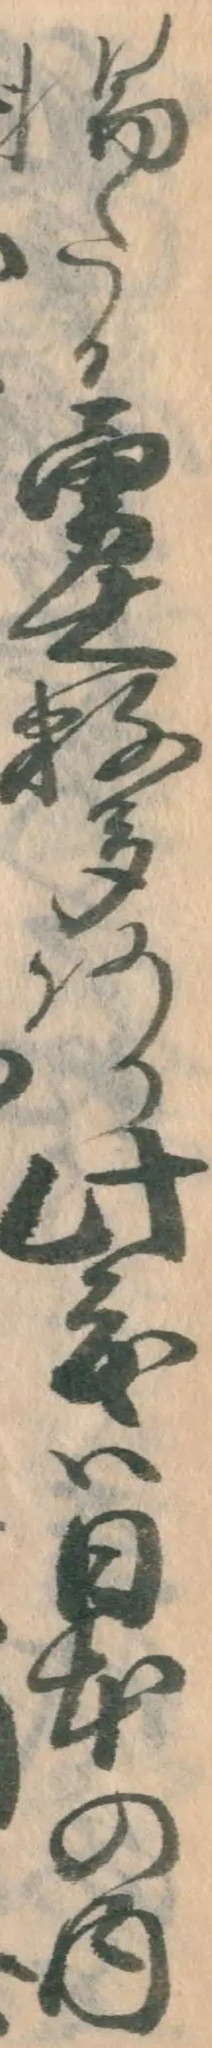揚たる勇士数多あり此度ハ日本の内
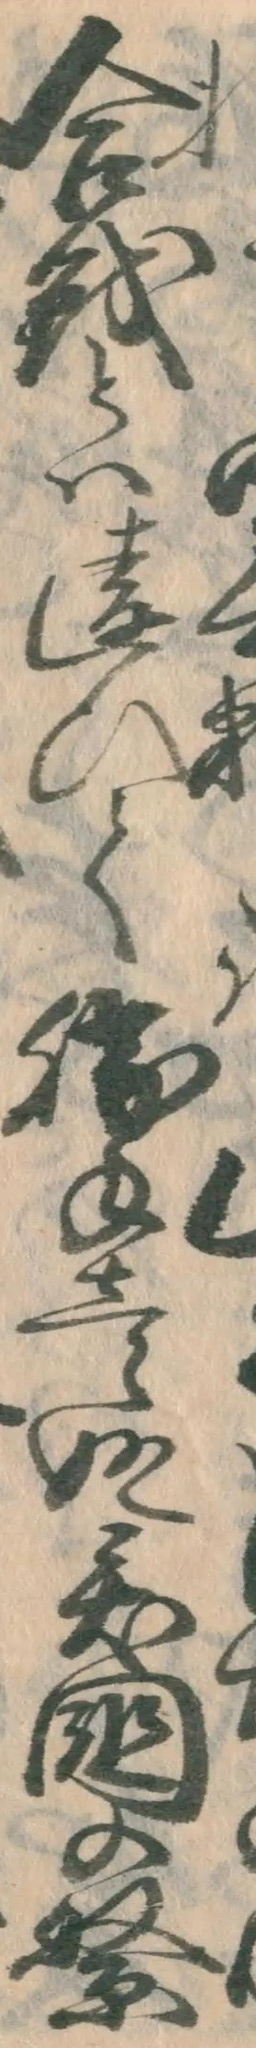合戦とハ違ひて勝手しらぬ異国の奴原
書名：麗斎叢書. 20
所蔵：国立国会図書館 National Diet Library, JAPAN
